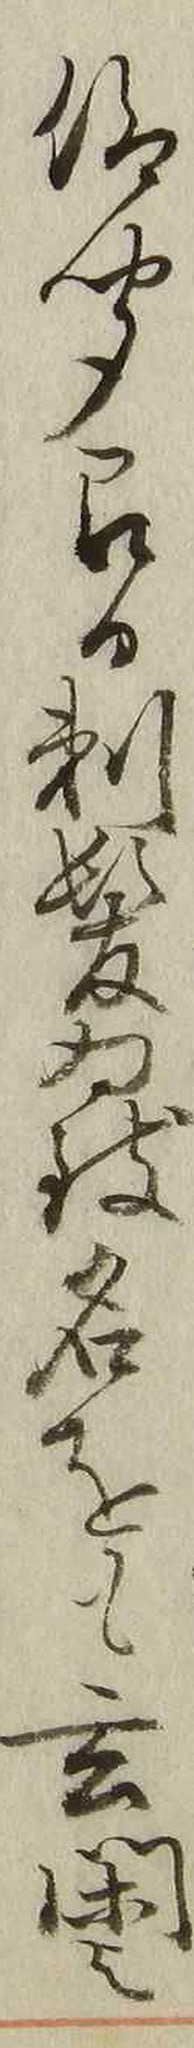仰聞即日剃髪為致名をも玄閑与
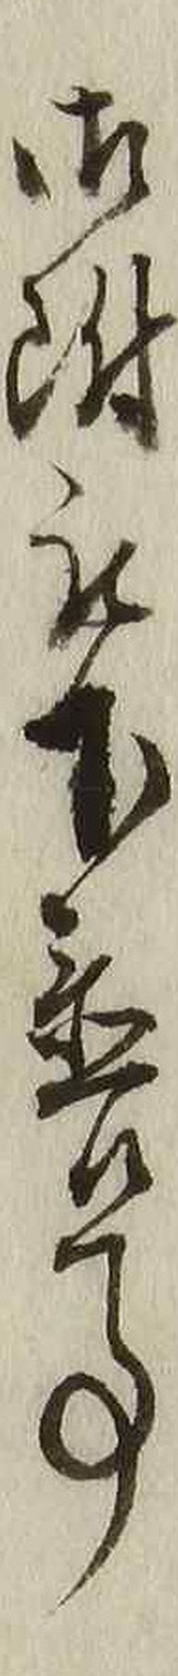御附被下置候事
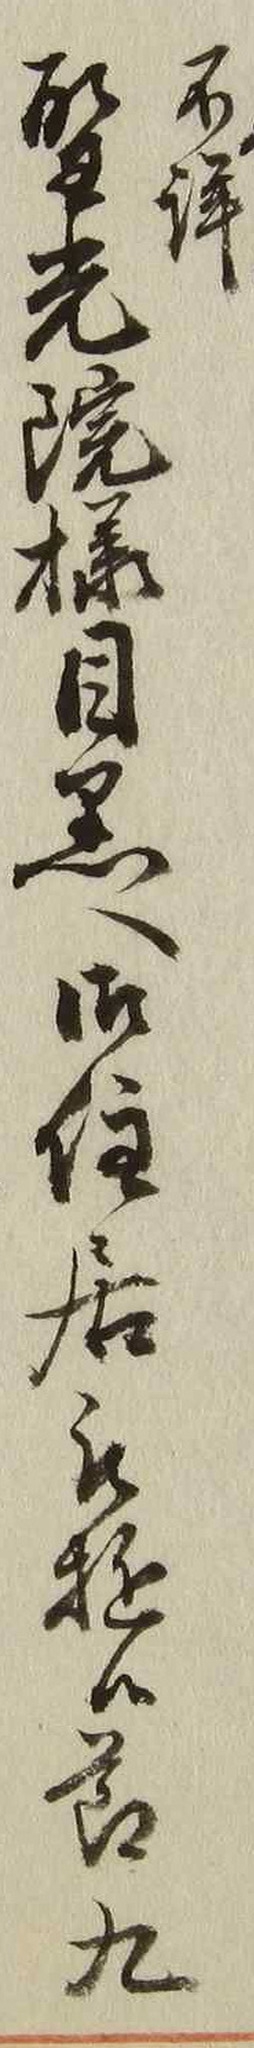聖光院様目黒へ御住居被遊候節九
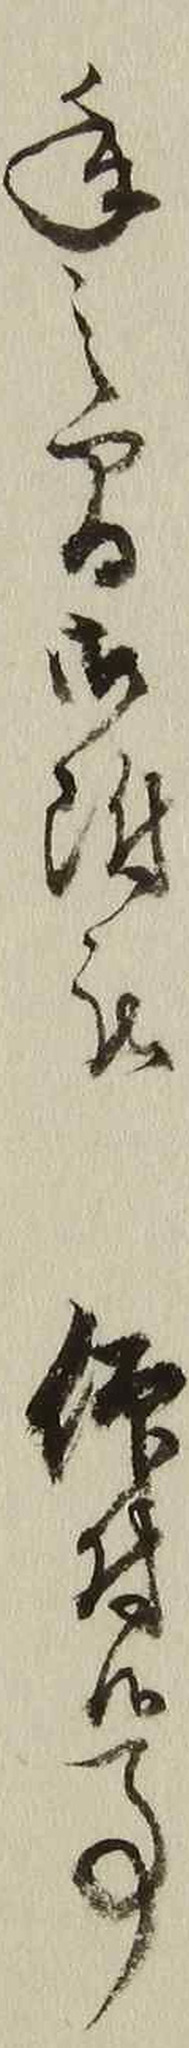年之間御附被仰付候事
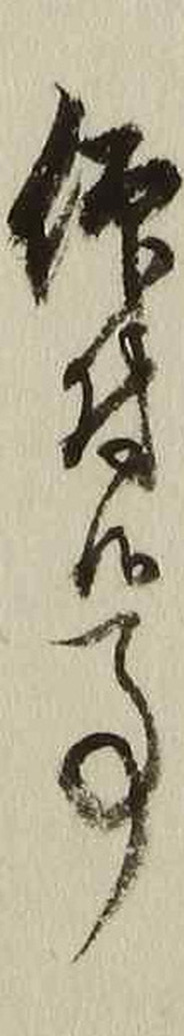仰付候事
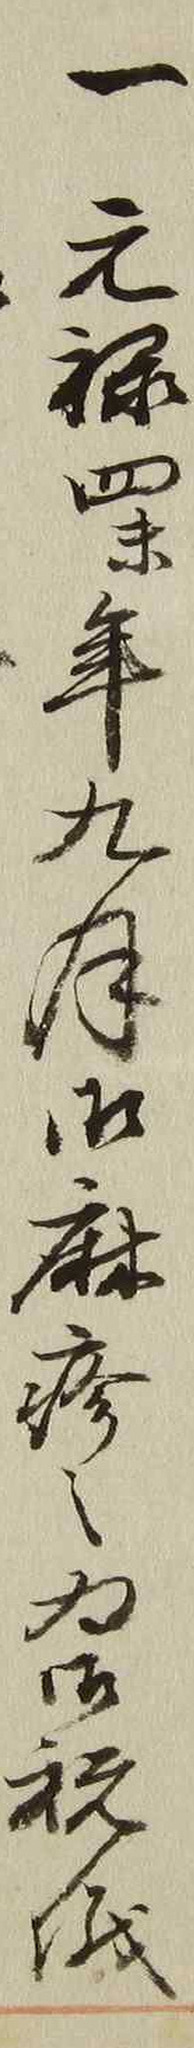一元禄四未年九月御麻疹之為御祝儀
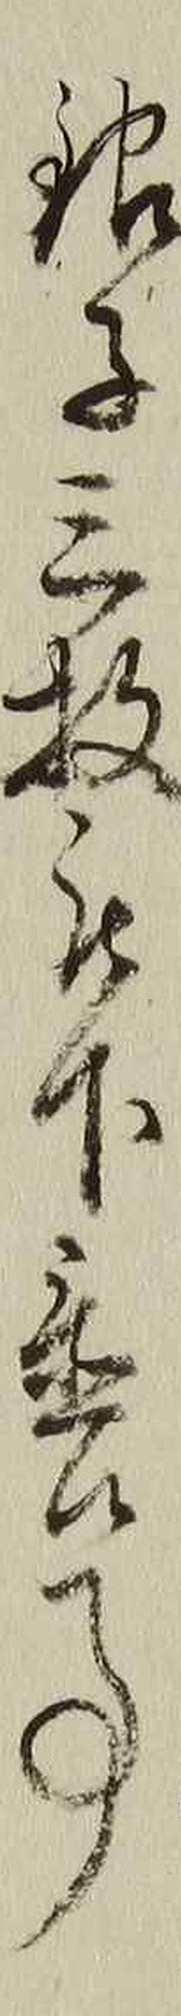銀子三枚被下置候事
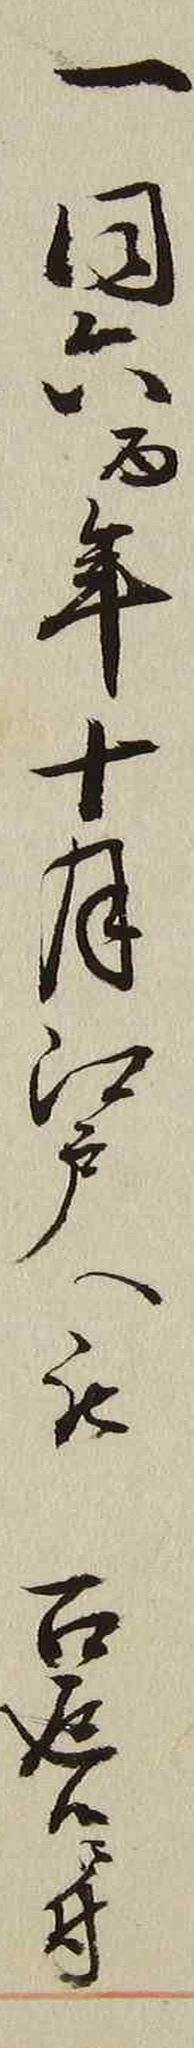一同六酉年十月江戸へ被召返候ニ付
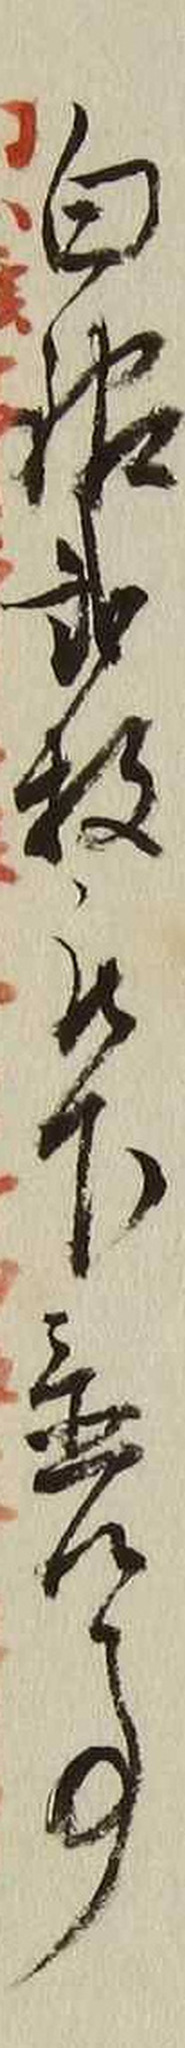白銀弐枚被下置候事
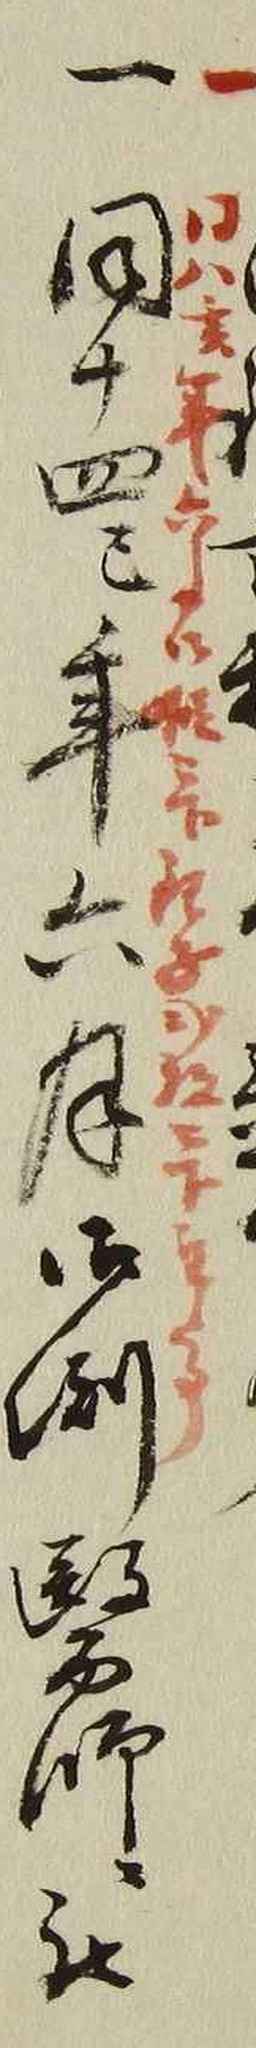一同十四巳年六月御側医師ニ被
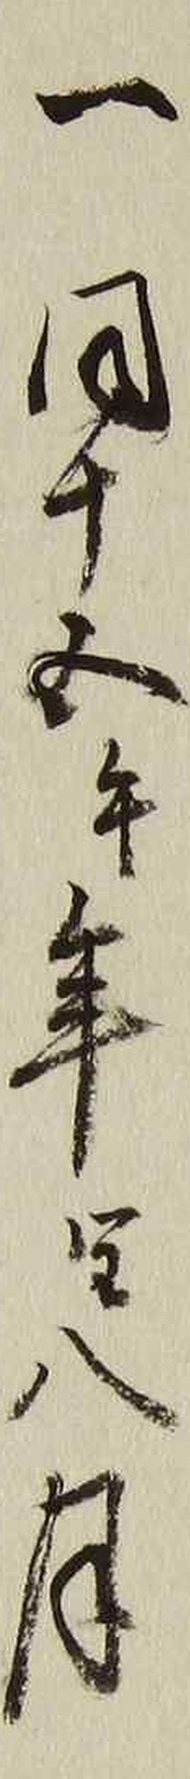一同十五午年閏八月
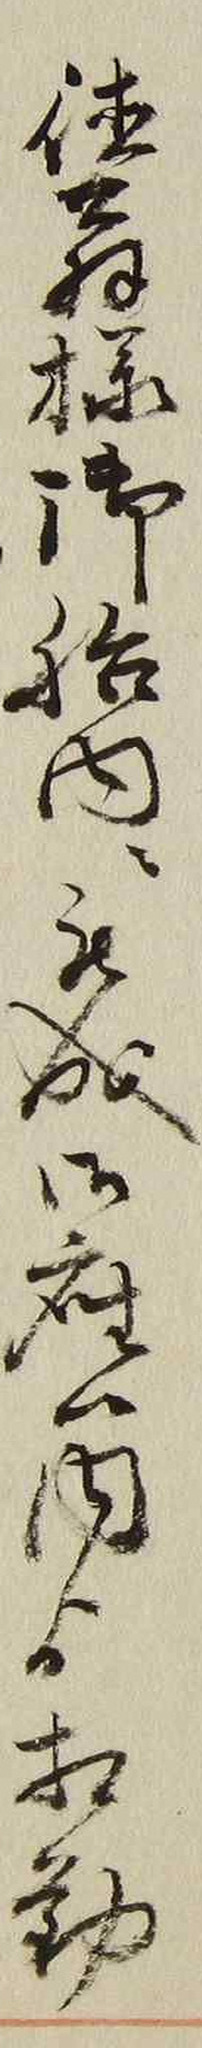徳翁様御胎内ニ被成御座候内ゟ相勤
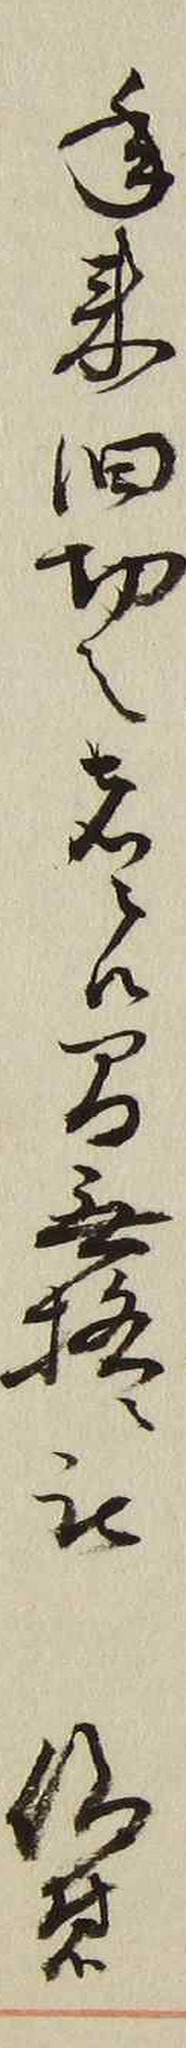年来旧功之者ニ候間無格ニ被仰付候
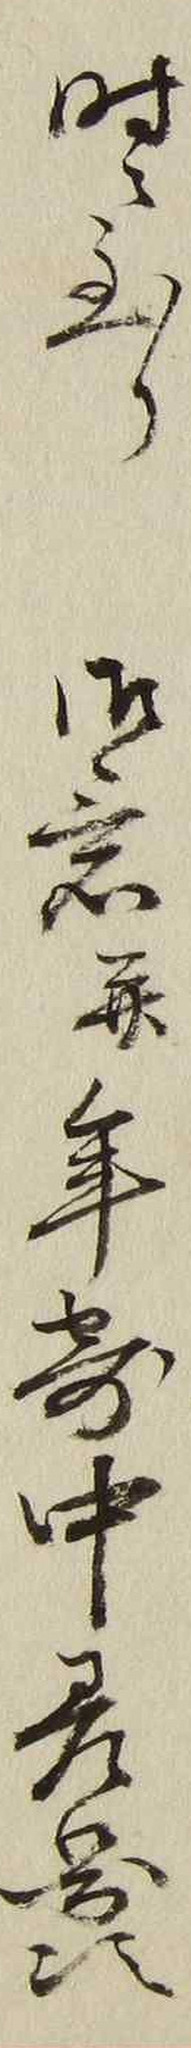時ニ至り御意并年寄中差図次

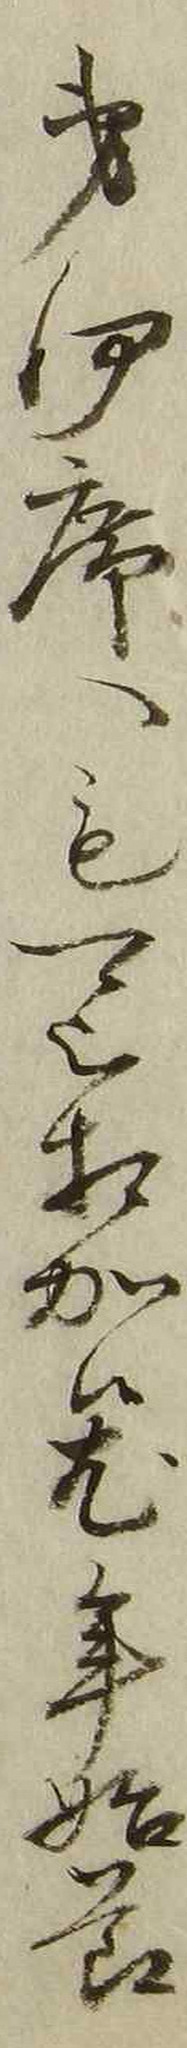第何席へも可被相加候尤年始節
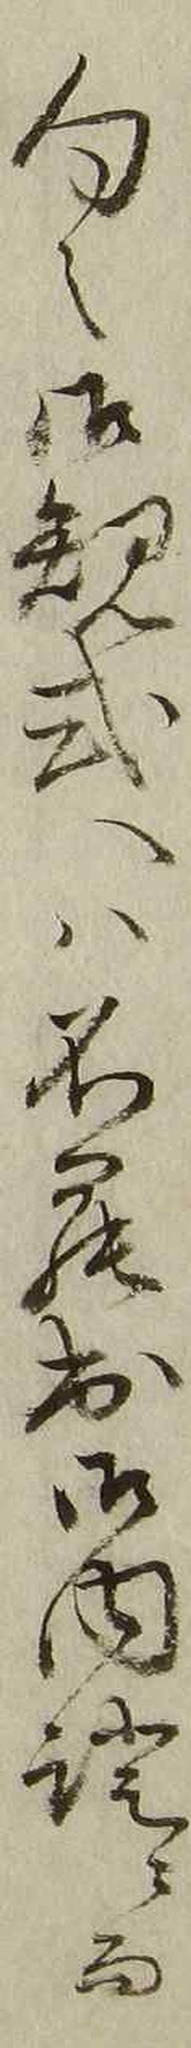句之御規式へハ不罷出御内証ニ而
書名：諸士系譜　巻之39　は之部7
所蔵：会津若松市立会津図書館
